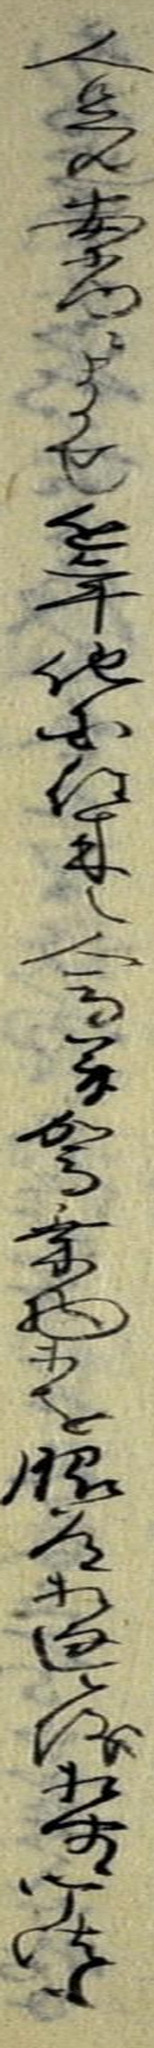人足共案内にまかせ近年他国往来之人馬并駕乗物等を脇道相通候儀相聞候御法も
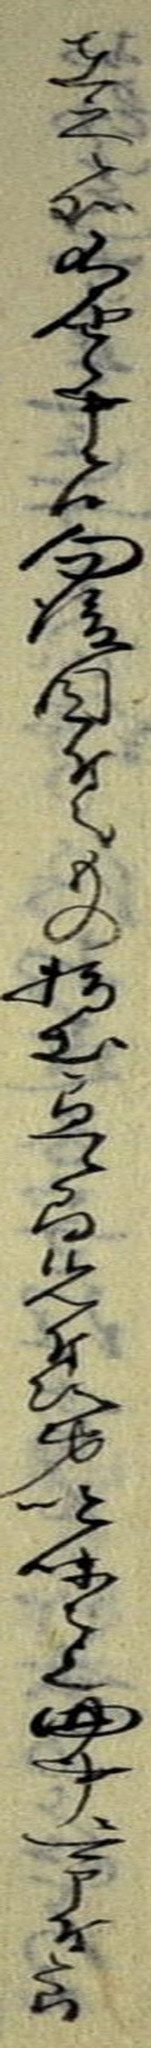在之候処不届之事に候向後目付之もの指出置候間見付次第吟味之上曲事に可申付候間
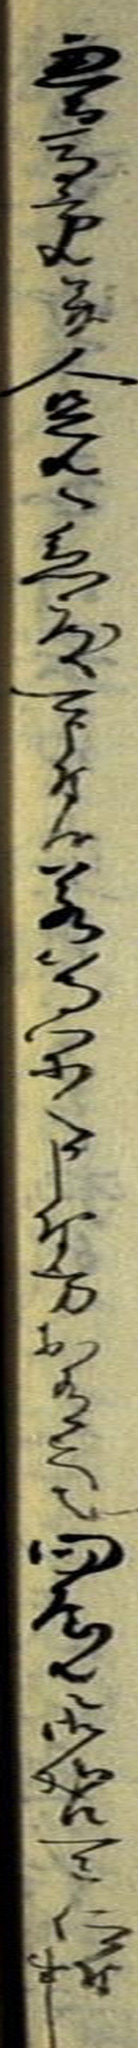兼而馬方共并人足共へ急度可申付候若等閑之申付方於有之は問屋共に御咎可被仰付事
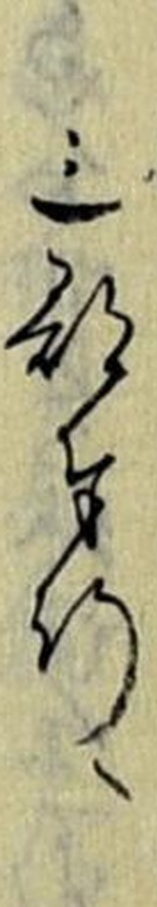三郡奉行へ
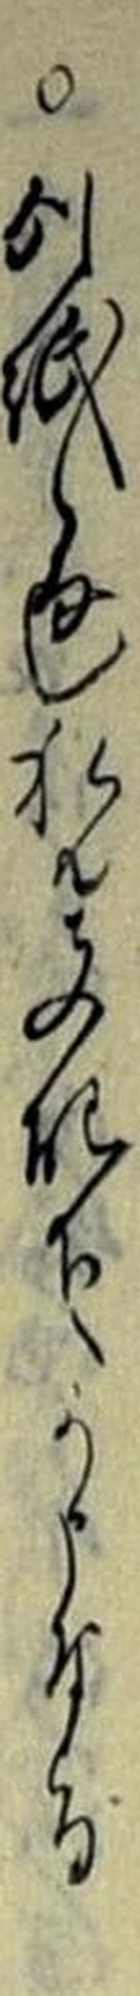〇別紙之通私共支配下へ可申付旨
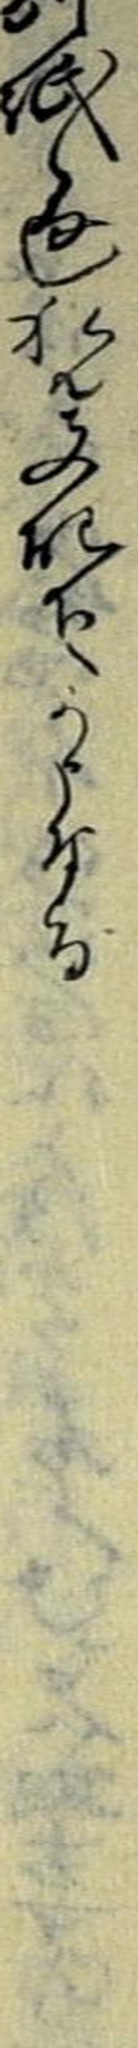〇別紙之通私共支配下へ可申付旨
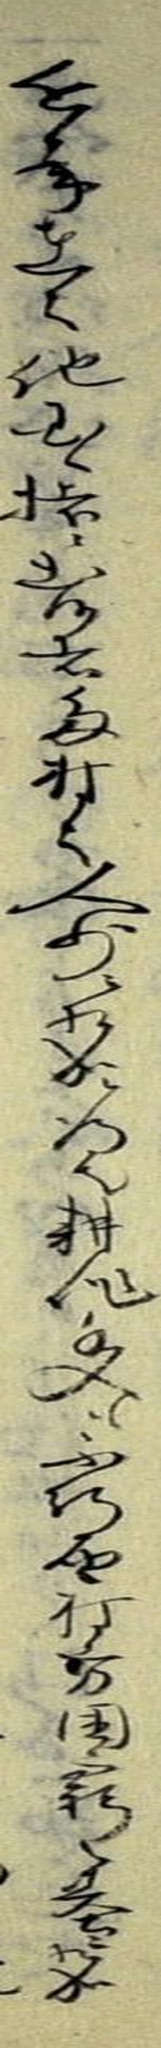近年在々他国へ挊に出候者多村々人少に相成候得は耕作手入も不行届村方困窮之基に相成
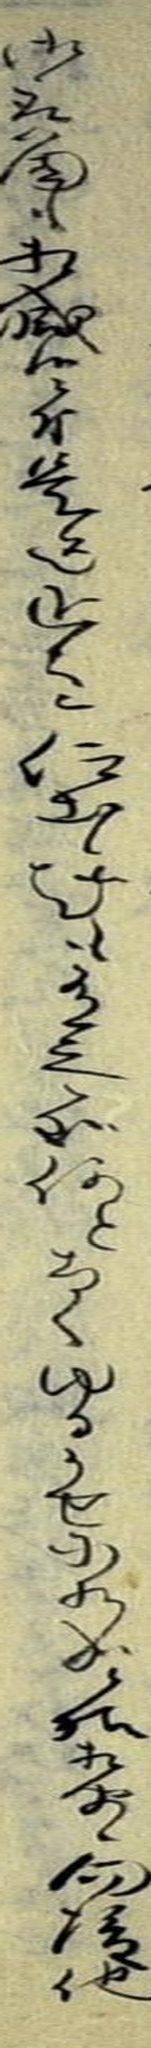御取箇も相減候に付是迄追々被仰出候趣も有之候処何となくゆるかせに相成候様相聞候向後他
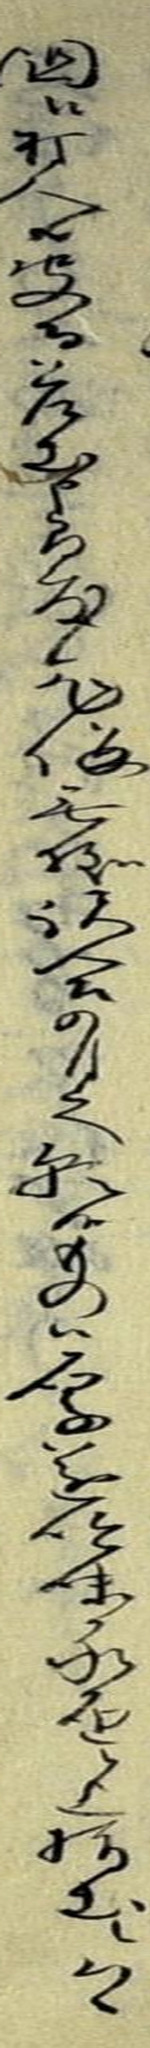国え村人共決而差出申間敷候乍併無拠訳合有之願候ものは厚遂吟味承届候上指出候はゝ
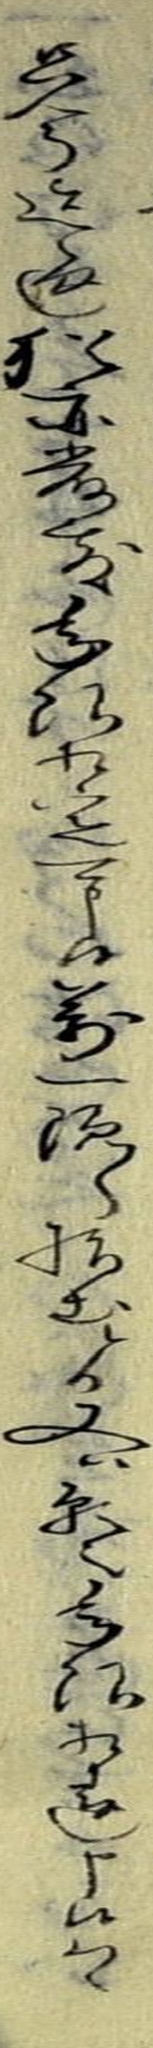只今迄之通猶亦厳敷年限相定可申候万一隠之指出候か又は願之年限相過申候はゝ
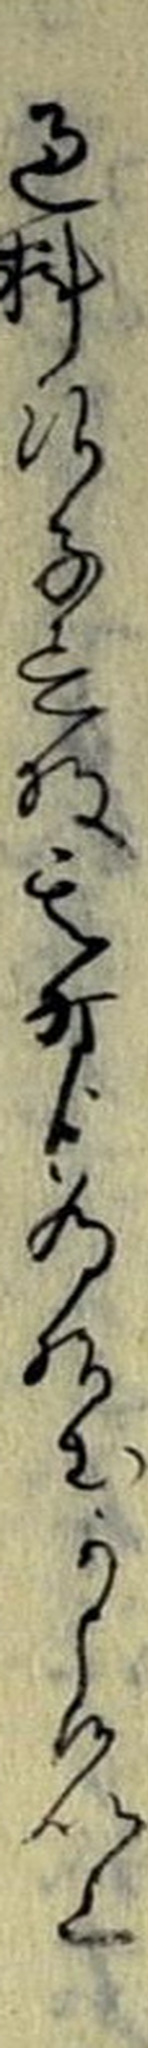過料銀子壱枚其村ゟ為指出可申候以上
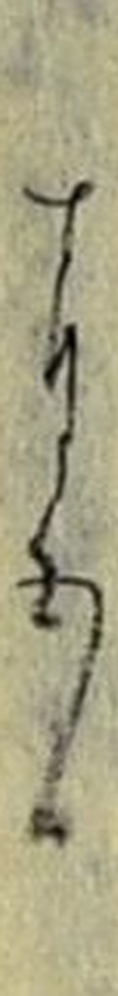十月五日
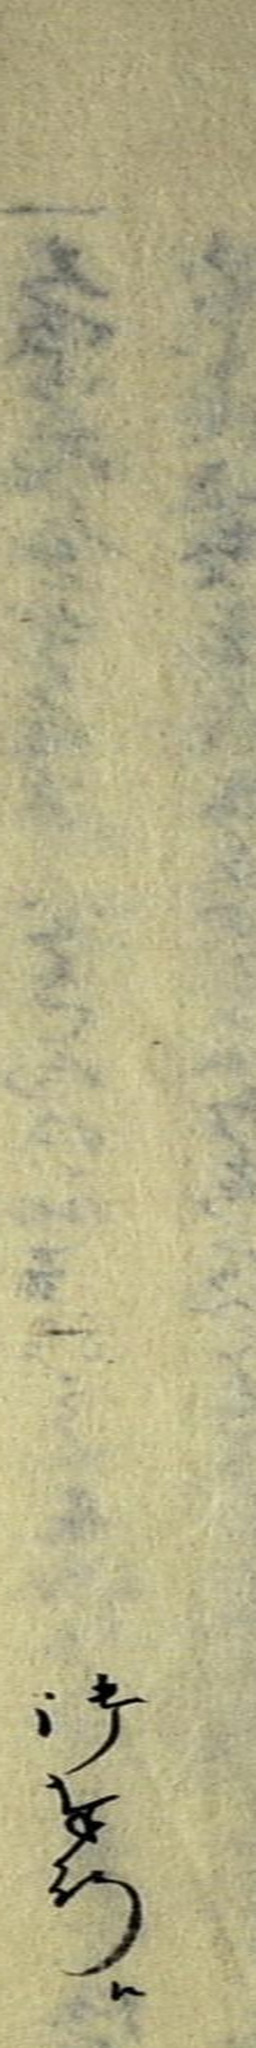御奉行え
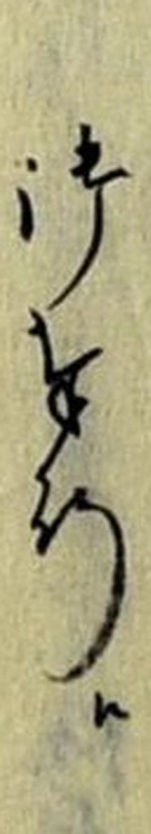御奉行え
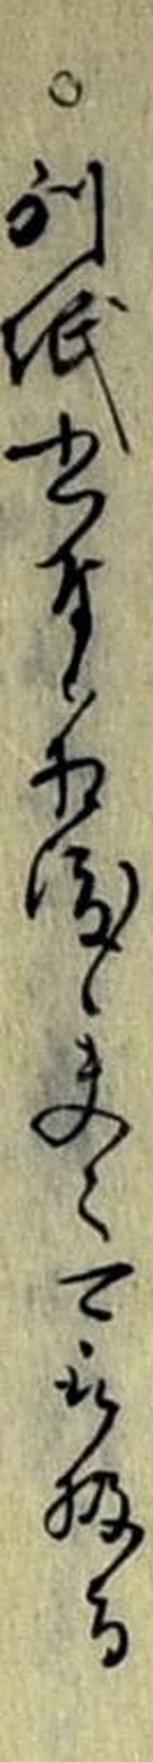〇別紙書付相渡候夫々可取扱旨
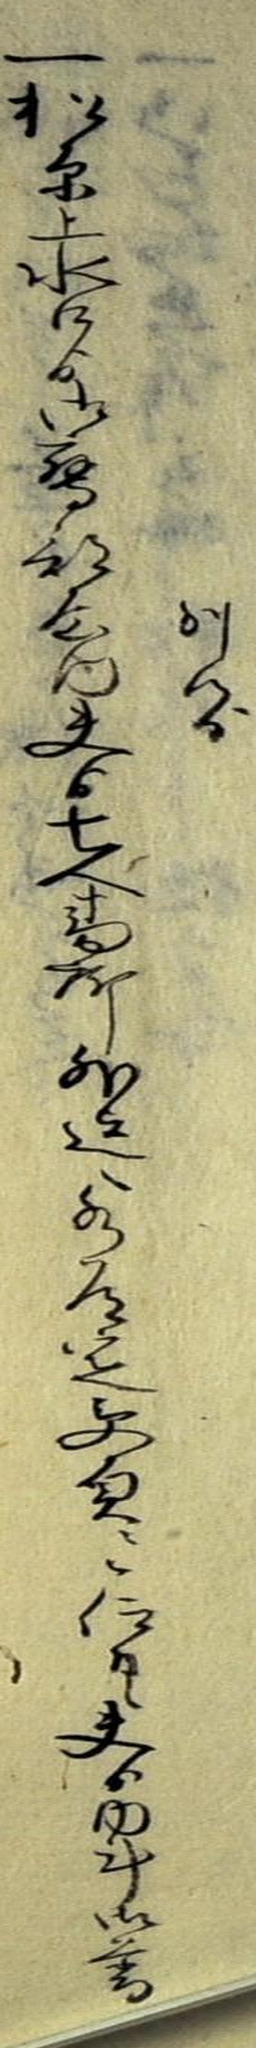一松原上水口ゟ御鷹部屋内夫ゟ七人番所外迄へ水道定受負に被仰付候夫ゟ内斗御普
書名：命令之部 二
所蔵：福井県文書館 Fukui Prefectural Archives
